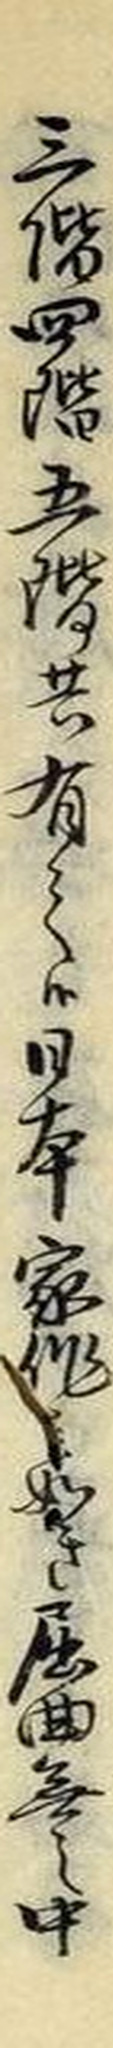三階四階五階共有之候日本家作之如き屈曲無之中
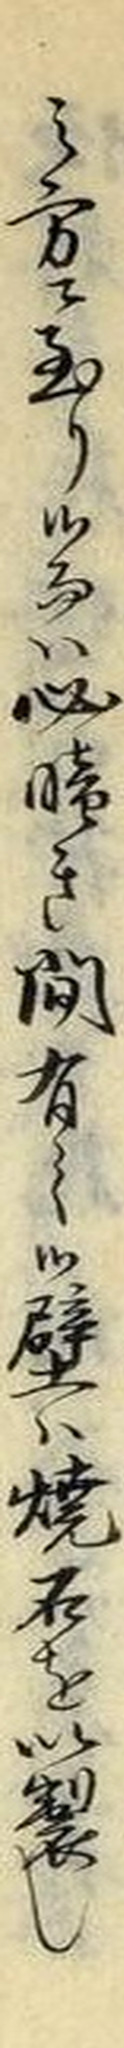之方ニ至り候而ハ必暗き間有之候壁ハ焼石を以製し
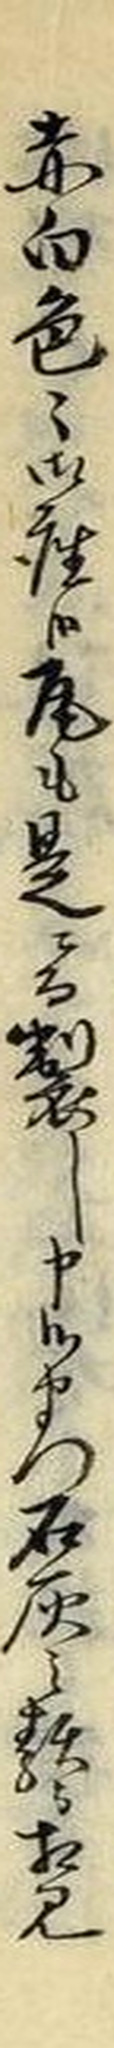赤白色々御座候瓦も是ニ而製し申候まつ石灰之類も相見
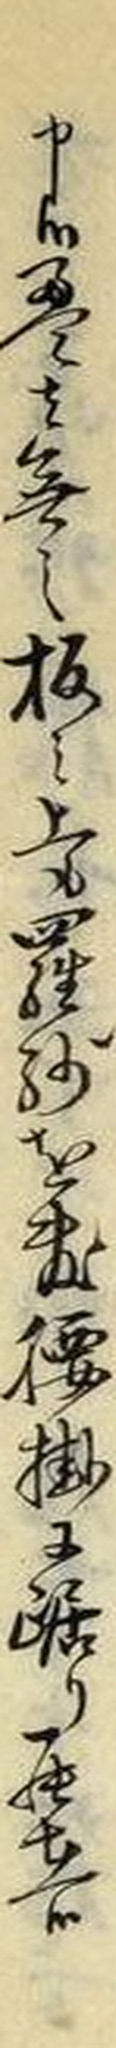申候畳者無之板之上も羅紗を敷腰掛に踞り罷在候
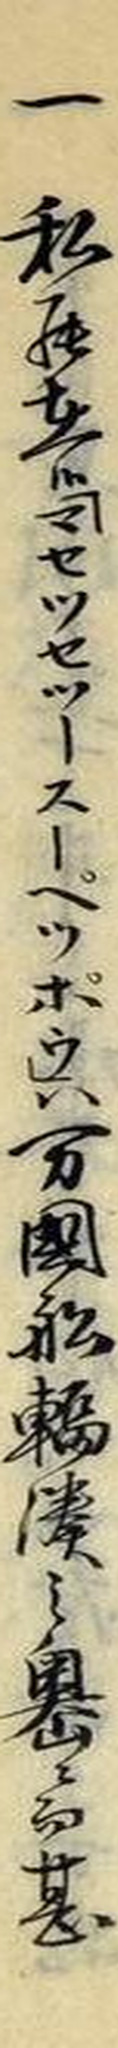一私罷在候「マセツセツースーぺツホウ」ハ万国船輻之奥山ニ而甚
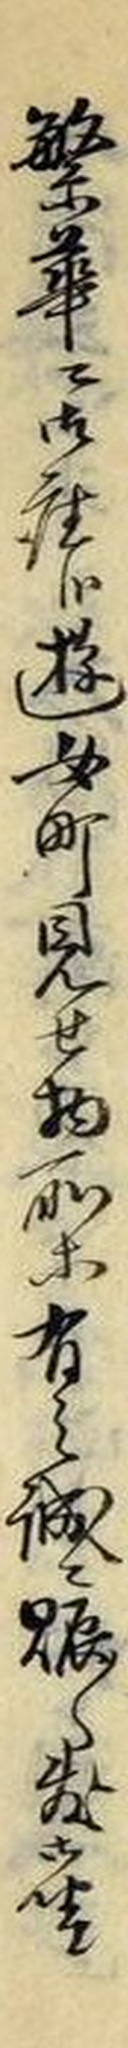繁華ニ御座候遊女町見せ物所等有之誠ニ賑し敷御座候

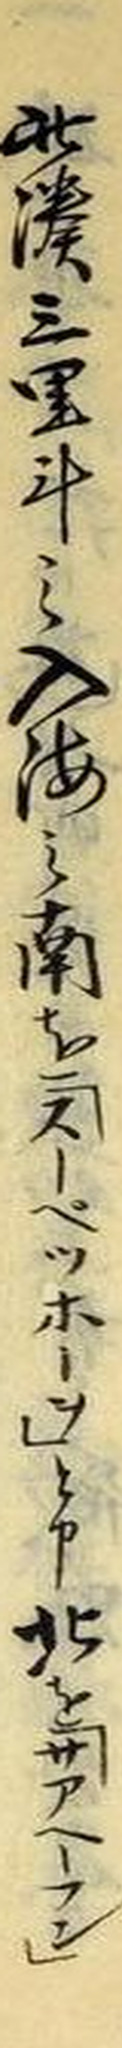此湊三里計之入海之南を「スーぺツホーヲ」と申北を「サアへーフン」
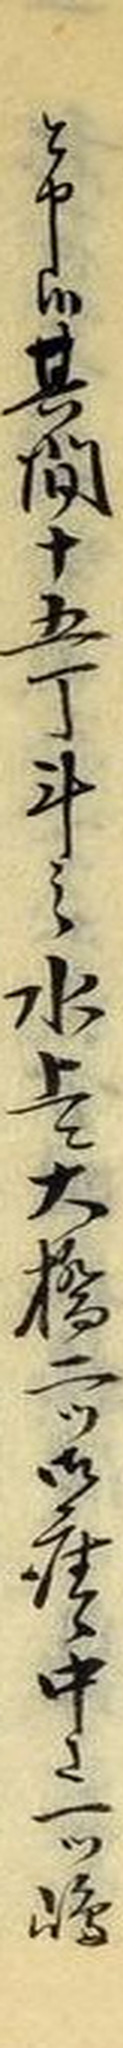と申候其間十五丁計之水上ニ大橋二ツ御座候中に一ツ嶋
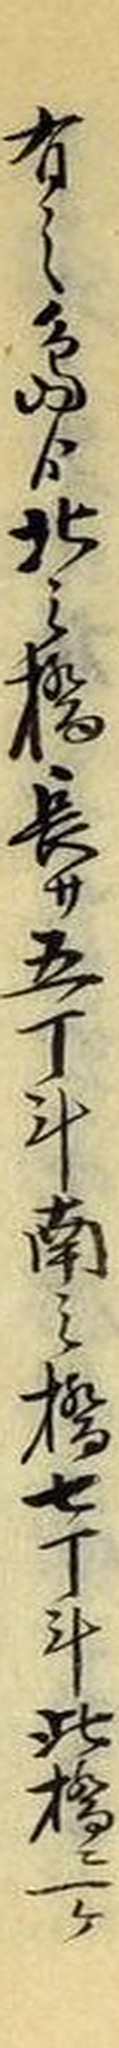有之嶋よゟ北之橋長サ五丁計南之橋七丁計此橋ニ一ヶ
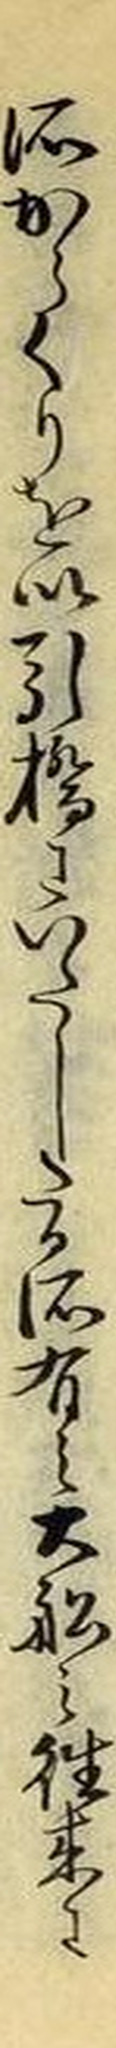所からくりを以引橋にいたしたる所有之大船之往来に
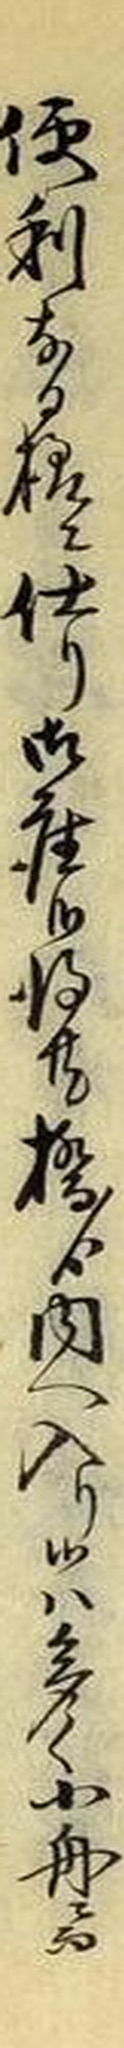便利なる様ニ仕り御座候得共橋ゟ内へ入り候ハ多く小舟ニ而
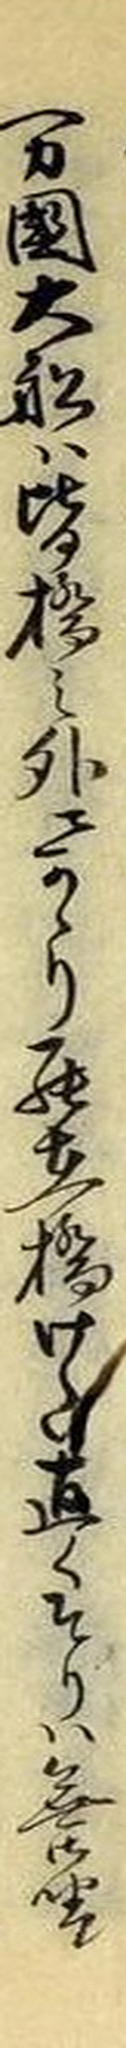万国大船ハ皆橋之外ニかゝり罷在橋けた直くそりハ無御座候
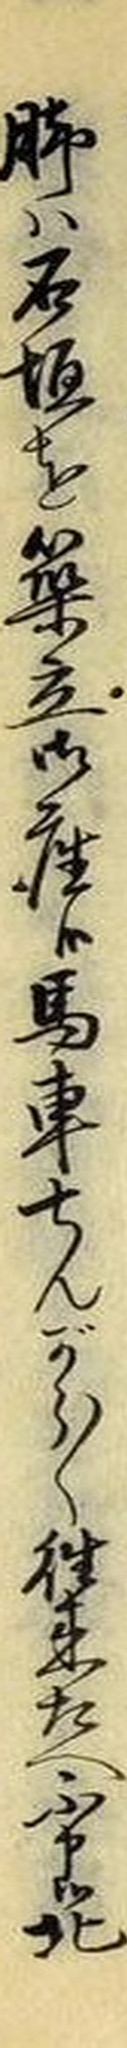脚ハ石垣を築立御座候馬車七んがら〳〵往来たへ不申候北
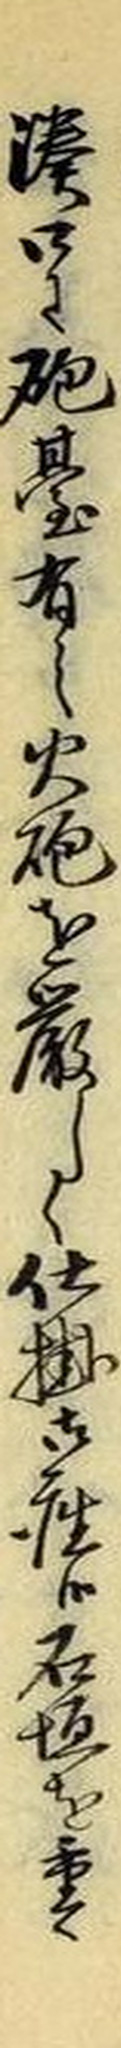湊口に砲台有之火砲を厳しく仕掛御座候石垣を重
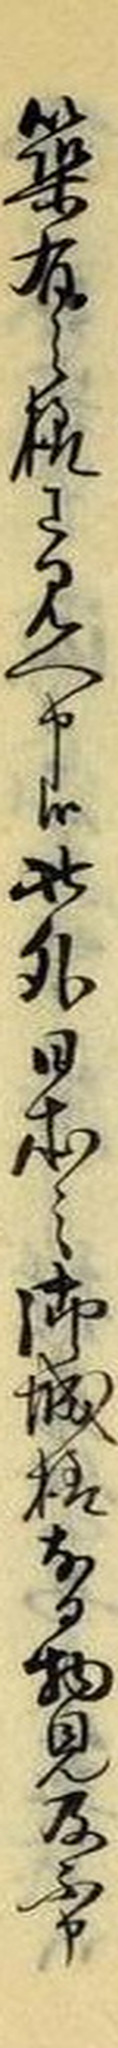築有之様に見へ申候此外日本の御城様なる物見及不申
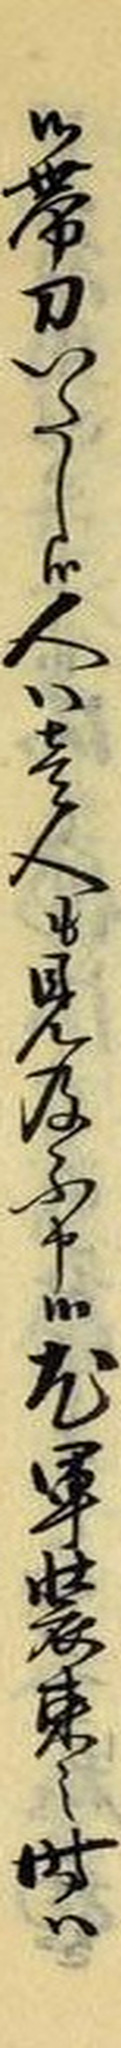御帯刀いたし候人ハ一人も見及不申候尤軍装束之時ハ
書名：漂客談奇（備考雑録写8）
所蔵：福井県文書館 Fukui Prefectural Archives
